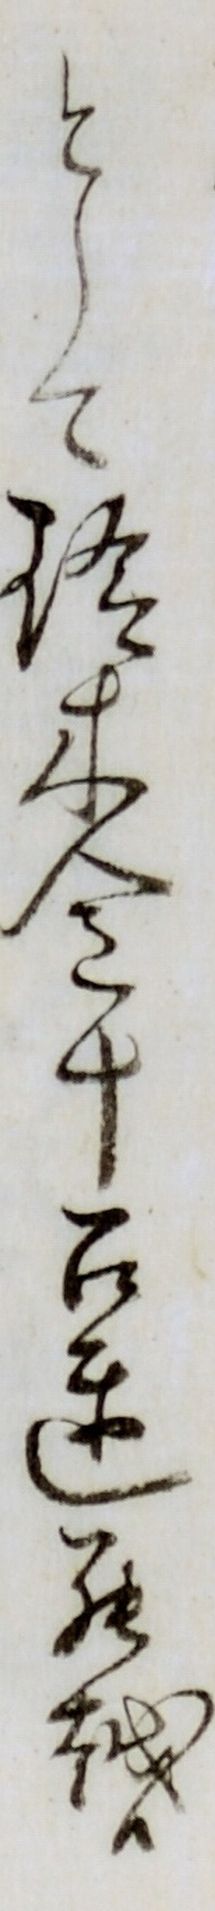として鈴木金十召連罷越候
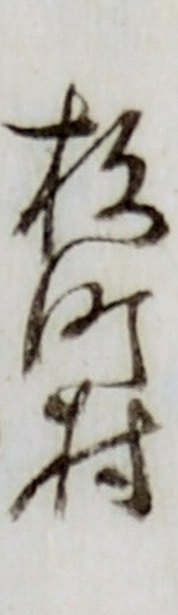杉町村
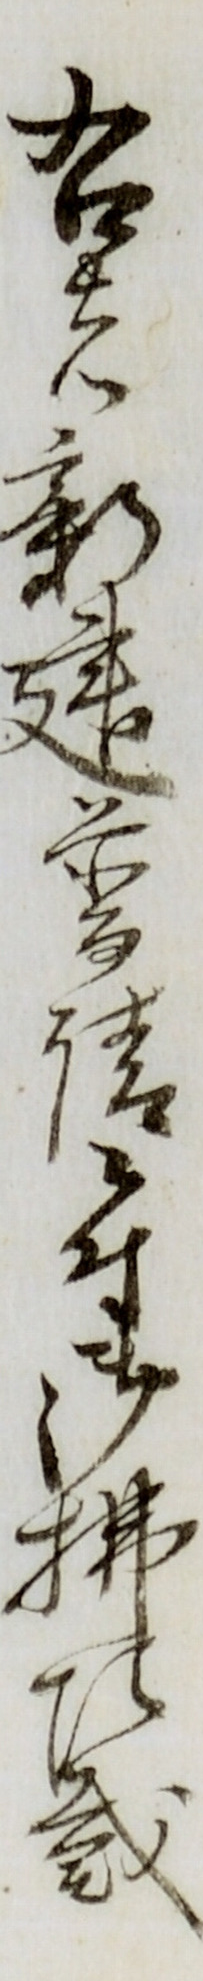右は新建普請に付御払頂戴
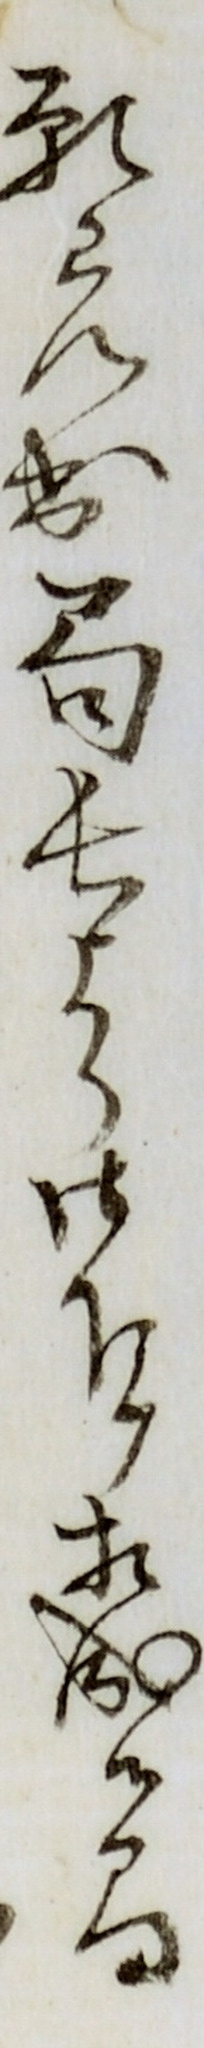願差出局長より御下ケ相成候間
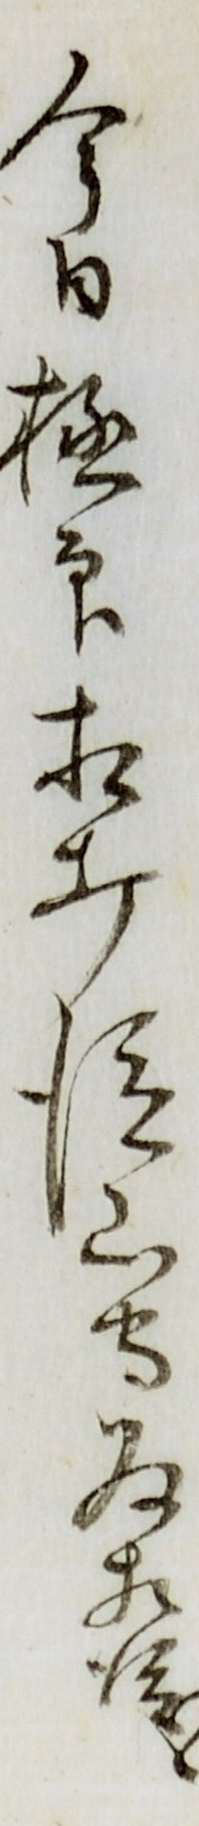今日極印相打従山守為相渡候
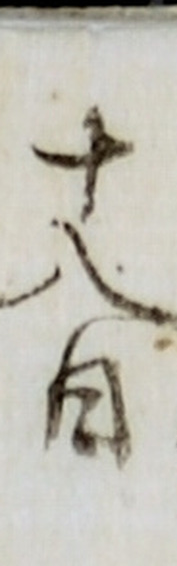十八日
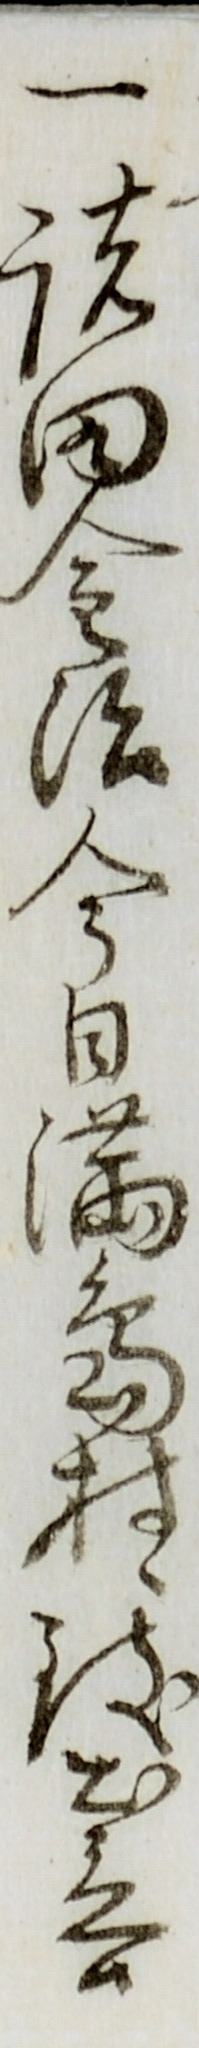一諸田金治今日満島村へ致出立候
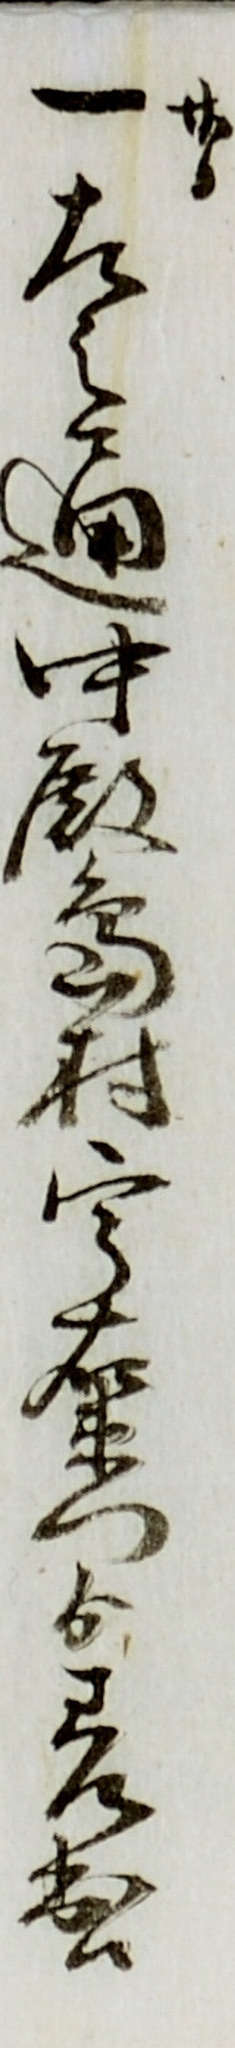一左之通中殿島村宇右衛門ゟ差出候
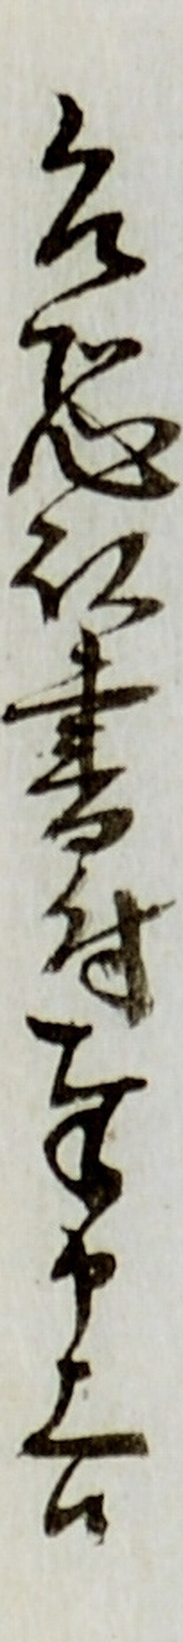乍恐以書付奉申上候
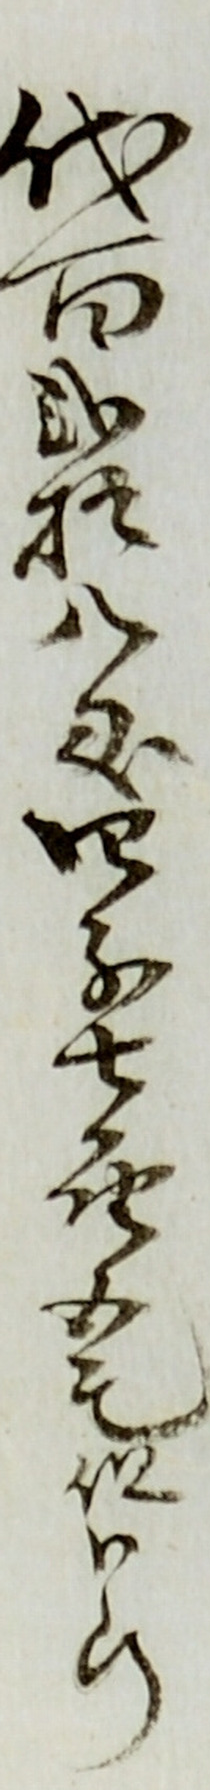代百弐拾八匁四分七厘五毛但同断
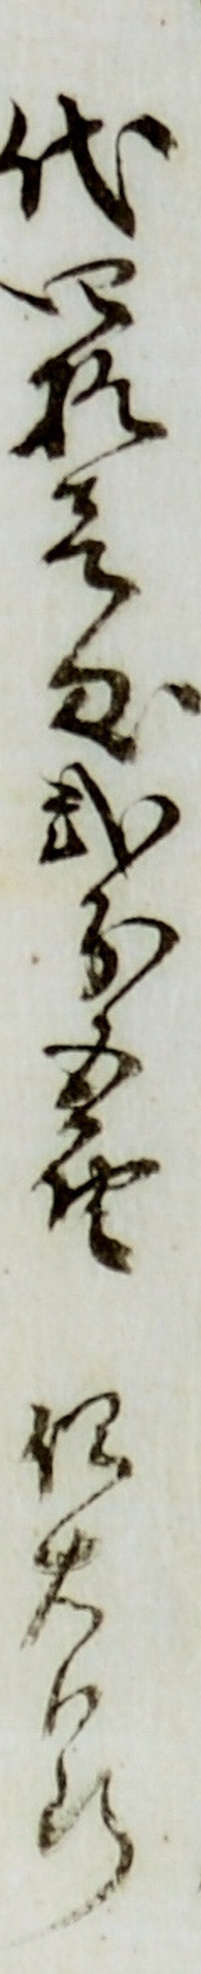代四拾壱匁弐分五厘但右同断
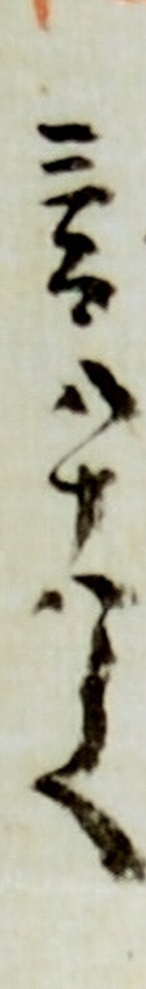三百八十八文

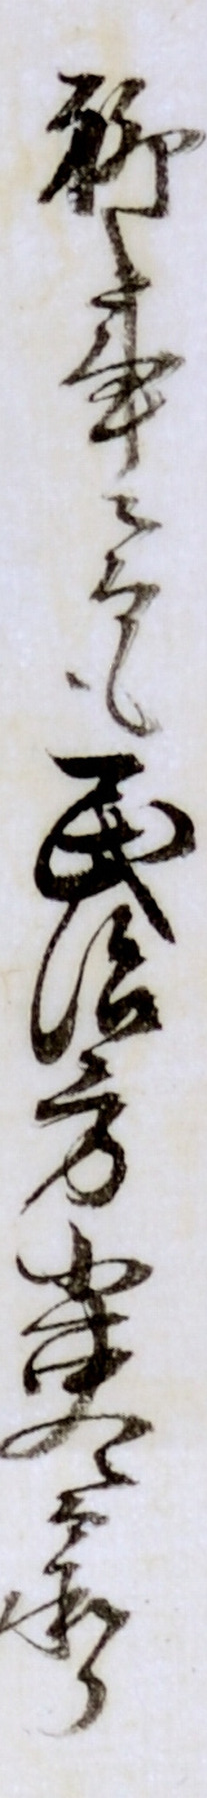聊之事にても民治方小吏にて承り
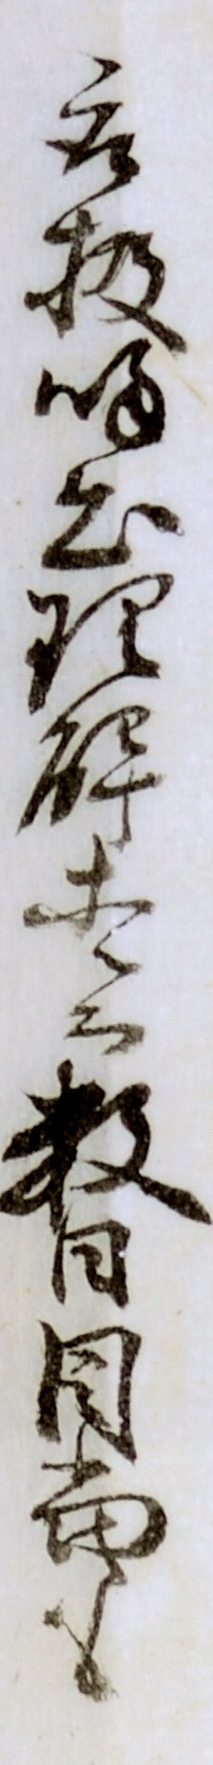取扱呼出理解等にて数日目当も
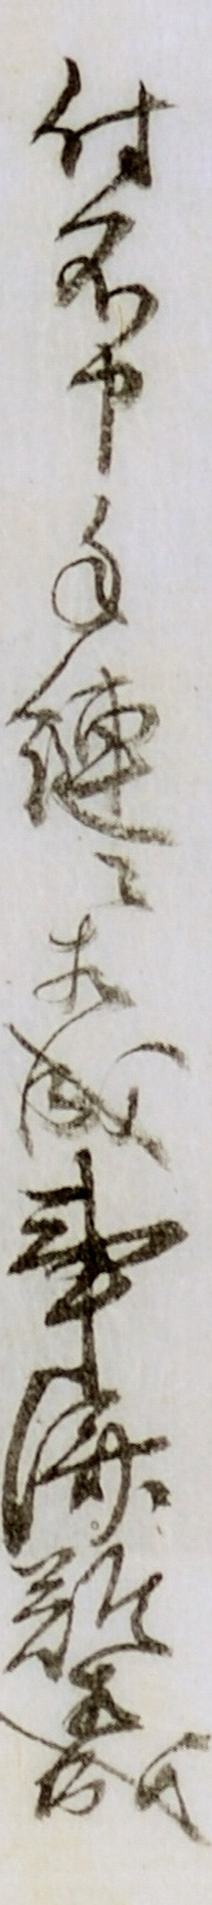付不申手縺に相成事済難相成
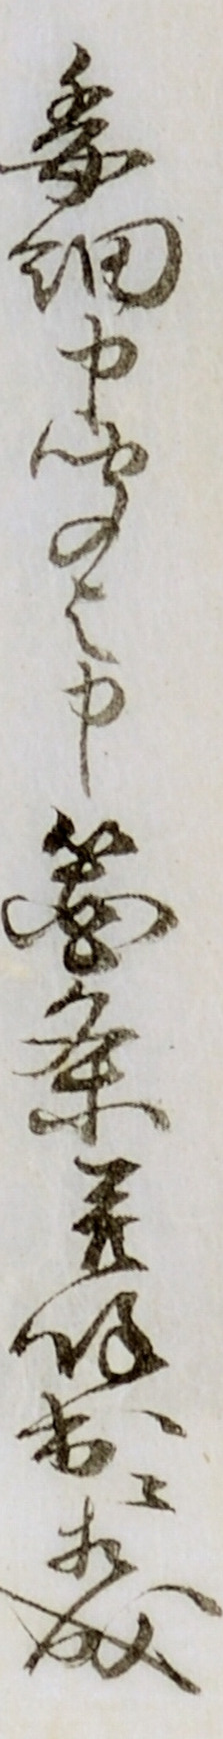委細申聞と申箇条幷呼出に相成
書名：山林方諸事御用留
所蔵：伊那市立高遠町図書館・合同会社AMANE
